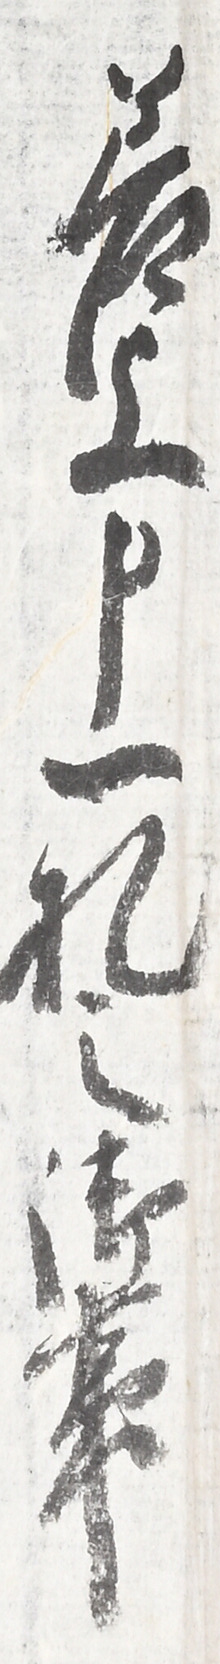差上申一札之御事
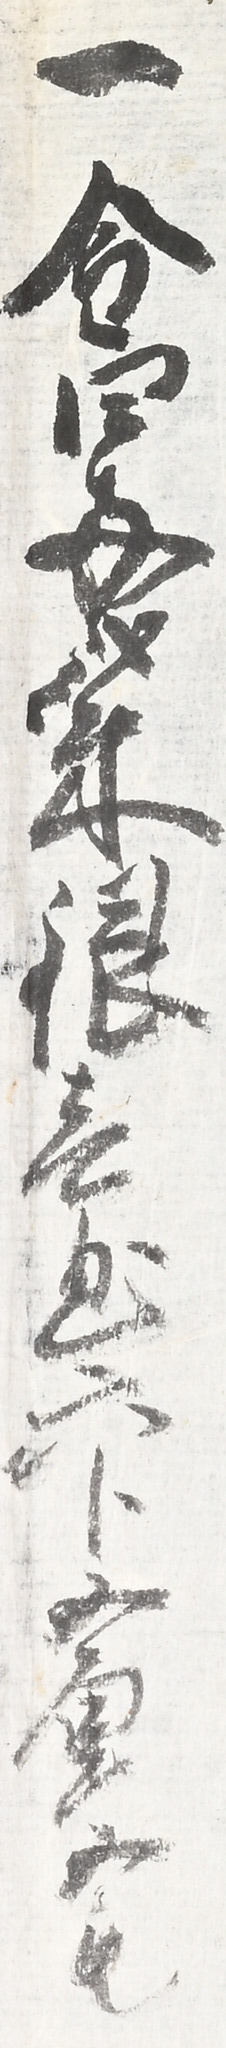一金四両弐朱銀壱匁六分五厘五毛
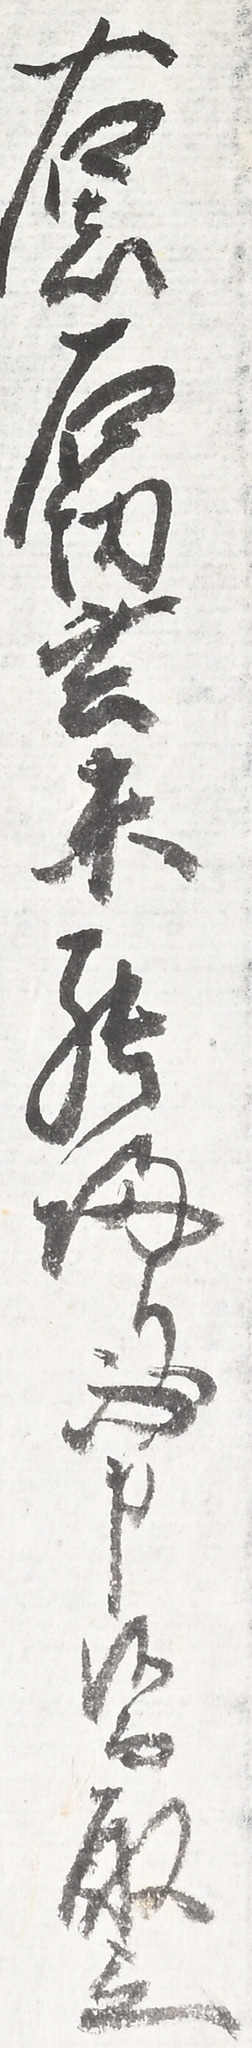右者石切共未罷帰り不申候而取立
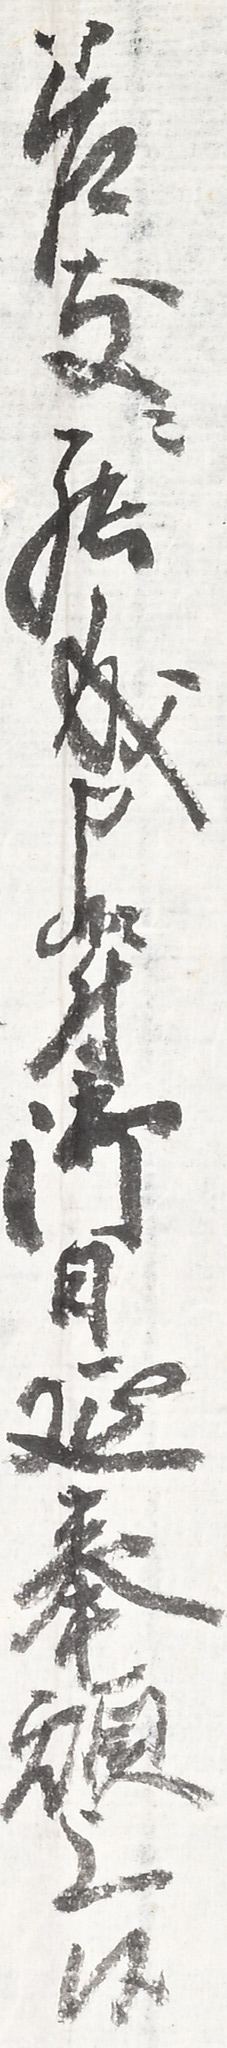差支ニ罷成申候ニ付御日延奉願上候
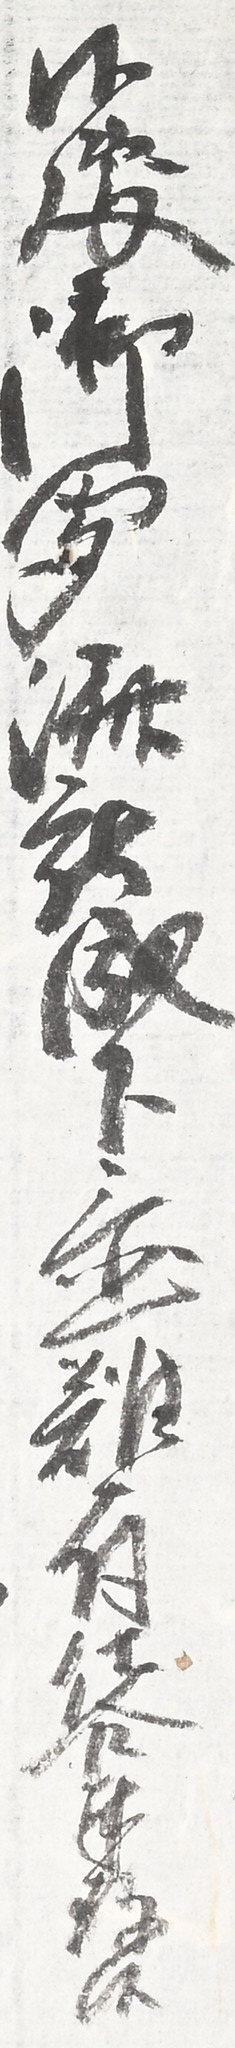候処御聞済被成下置難有仕合奉存候
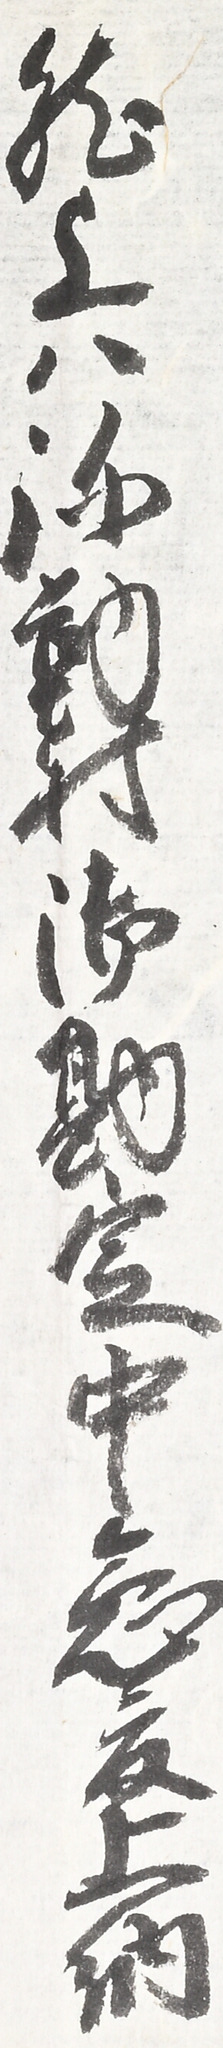然上ハ弥勒村御勘定中急度上納
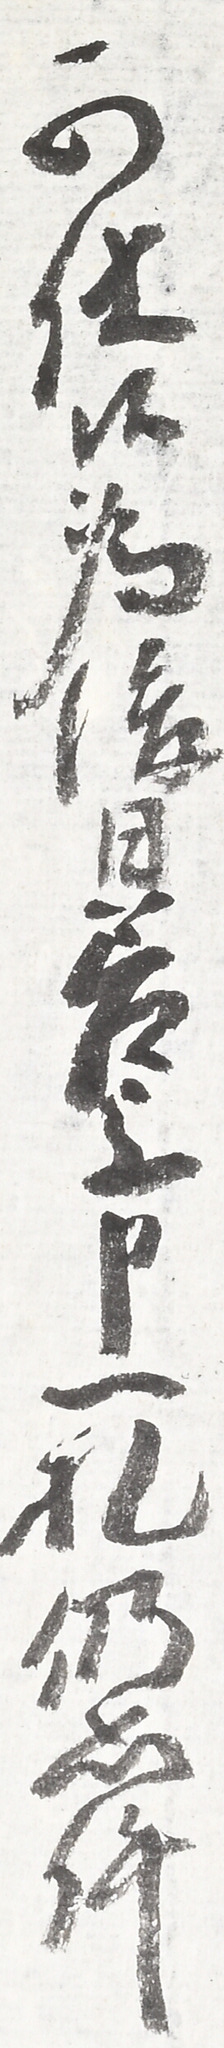可仕候為後日差上申一札仍如件
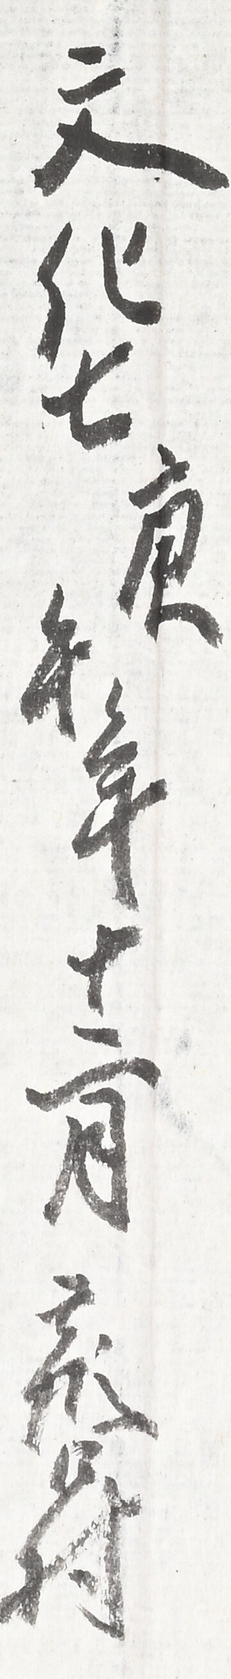文化七庚午年十二月荊口村
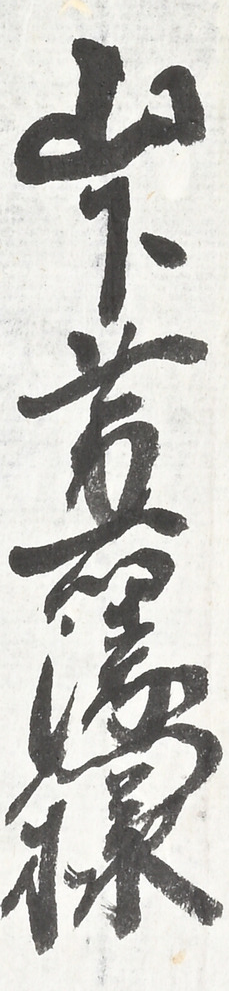山下芳右衛門様
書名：差上申一札之御事
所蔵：伊那市立高遠町図書館・合同会社AMANE
